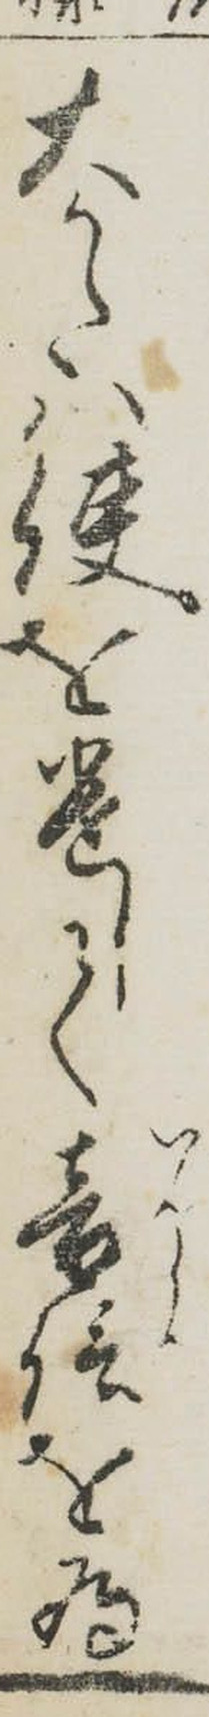大かたは使を遣して音信を為

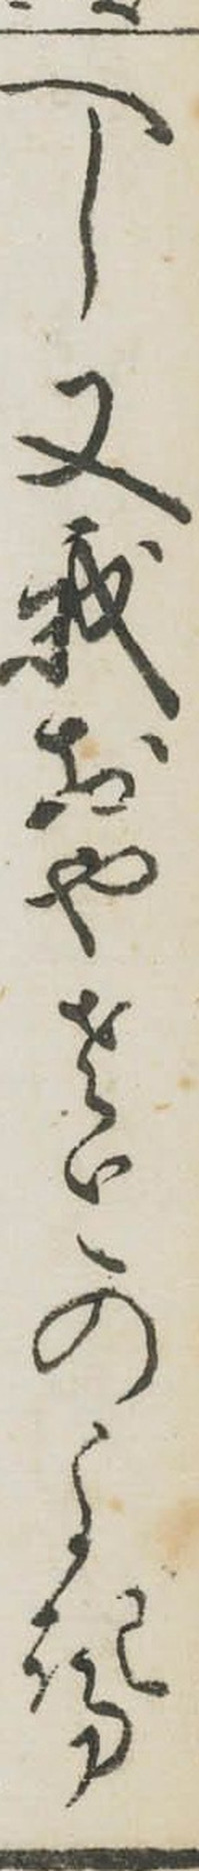へし又我おやさとのよき事
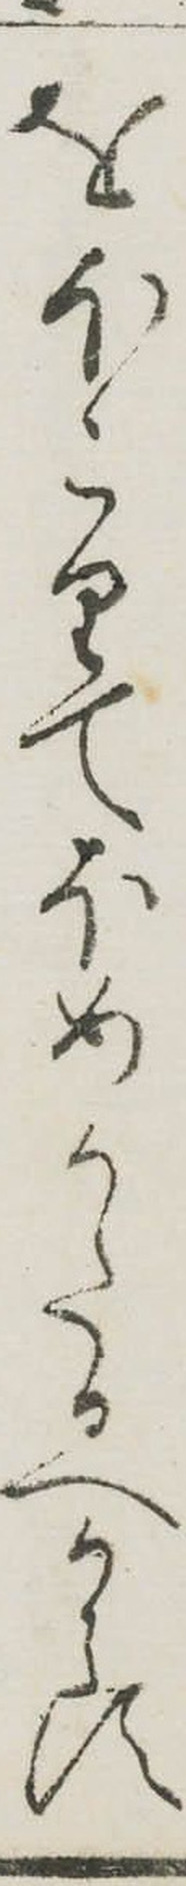をほこりてほめかたるへからす
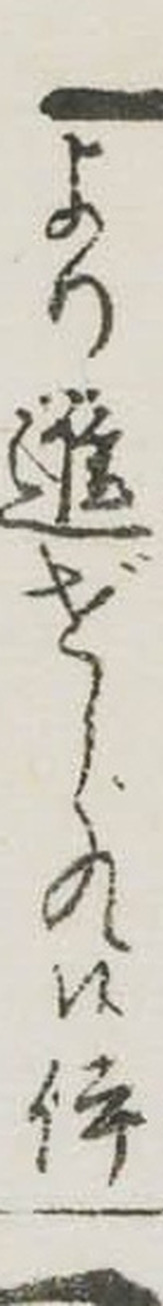より進ぜられ候伊
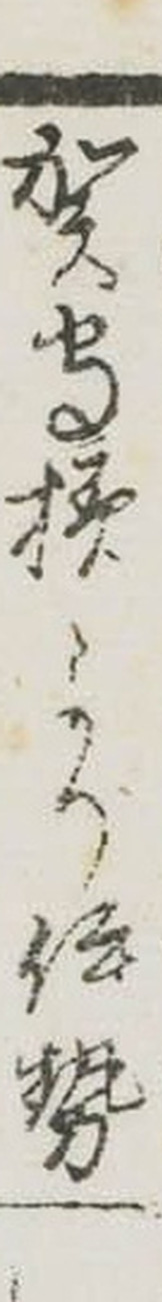賀守様より伊勢
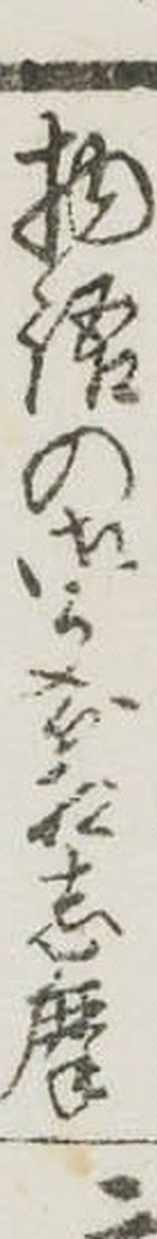物語の御文箱志摩
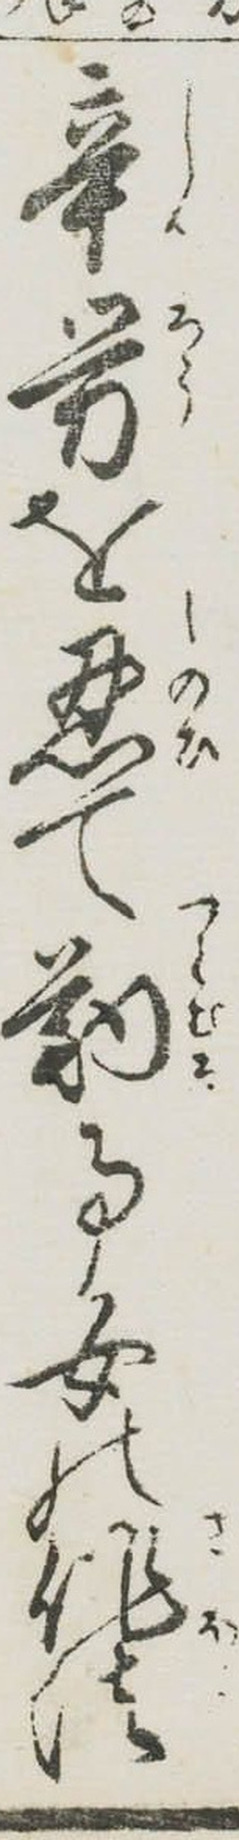辛労を忍て勤事女の作法
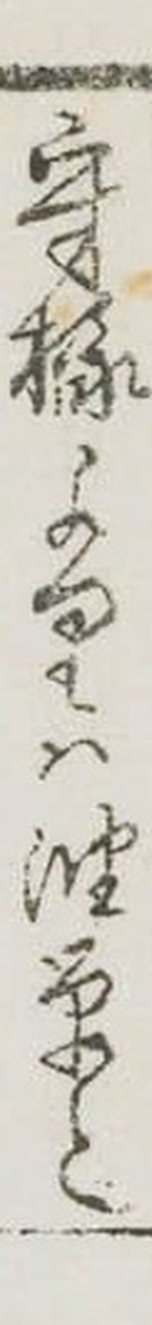守様よりは油単と
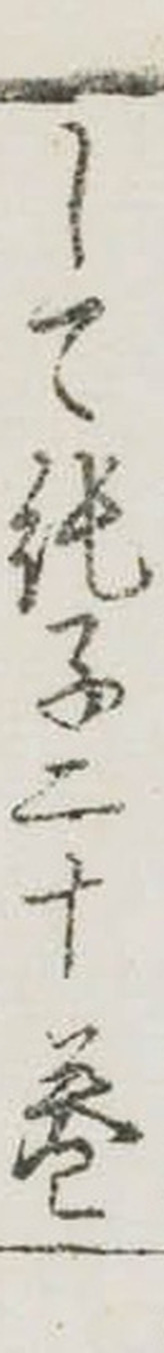して純子二十巻
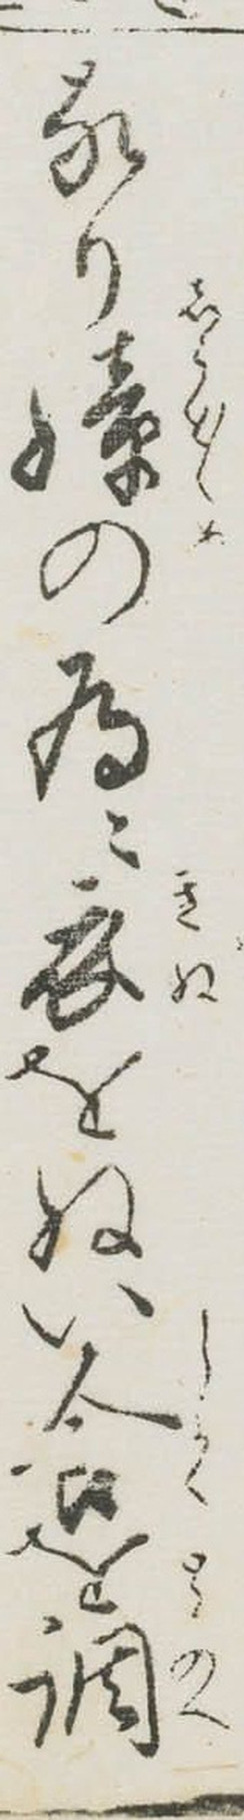なり嫜の為衣をぬい食を調
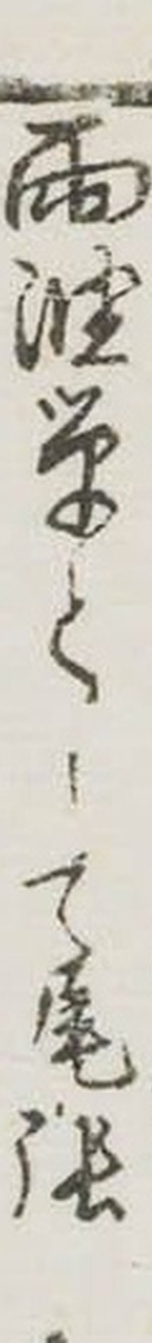雨油単として尾張
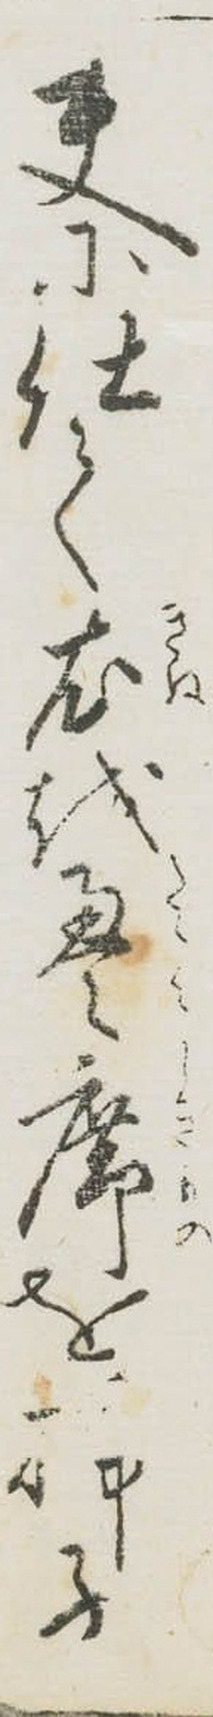夫に仕て衣を畳席を掃子
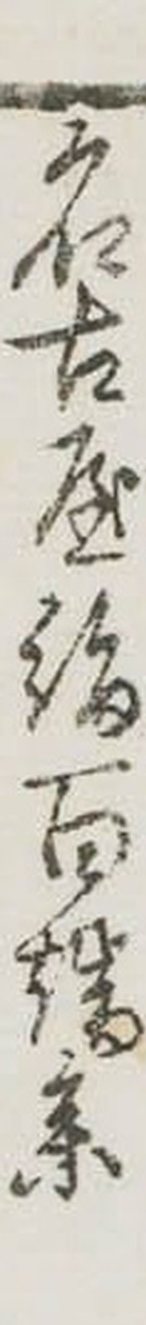名古屋絹百端参
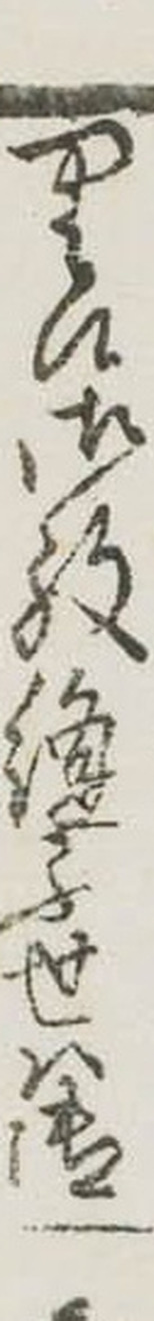り候御紋縫ふせは御
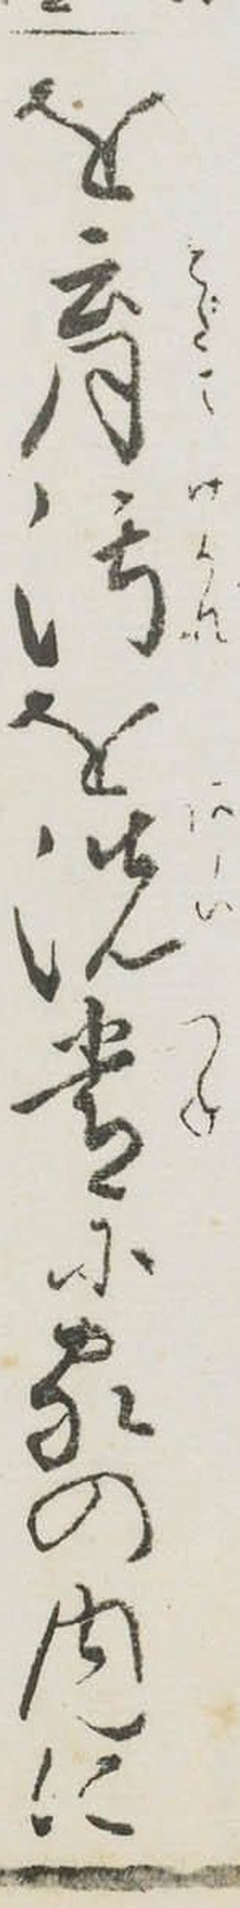を育汚を洗常に家の内に
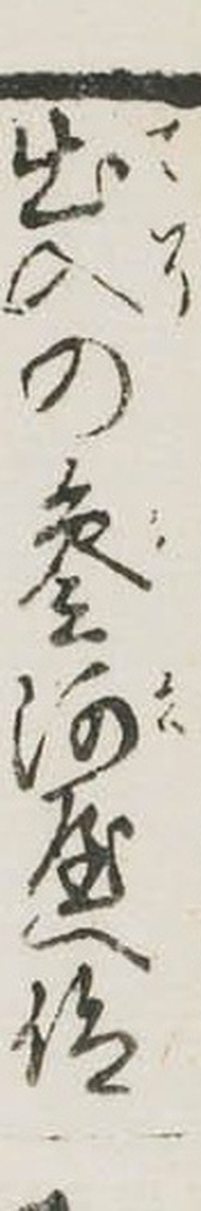出入の参河屋へ仰
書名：女大学
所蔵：東京学芸大学教育コンテンツアーカイブ
